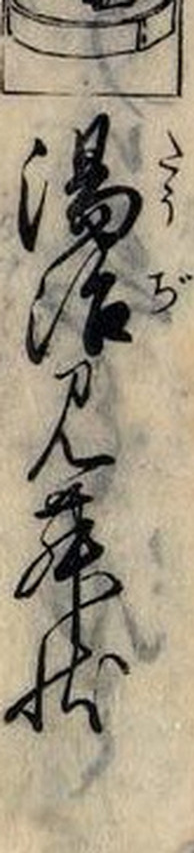湯治見舞状
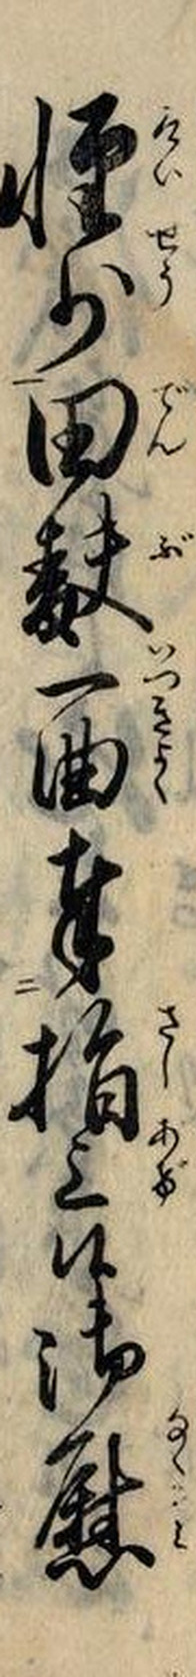軽少田麩一曲奉指上候御慰
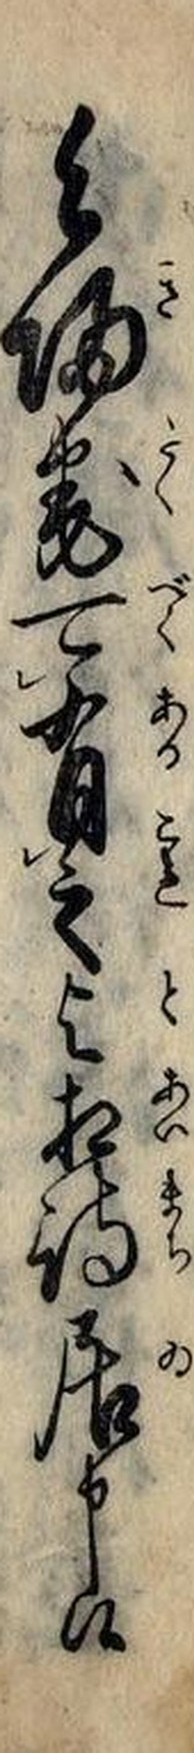御帰宅可有之与相待居申候
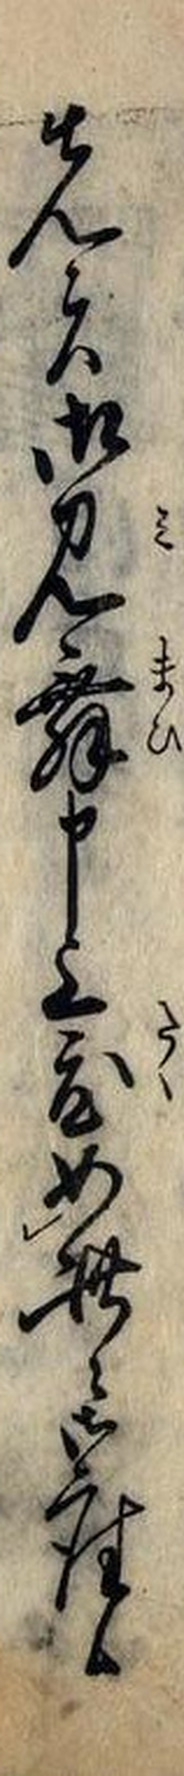先者御見舞申上度如此に御座候
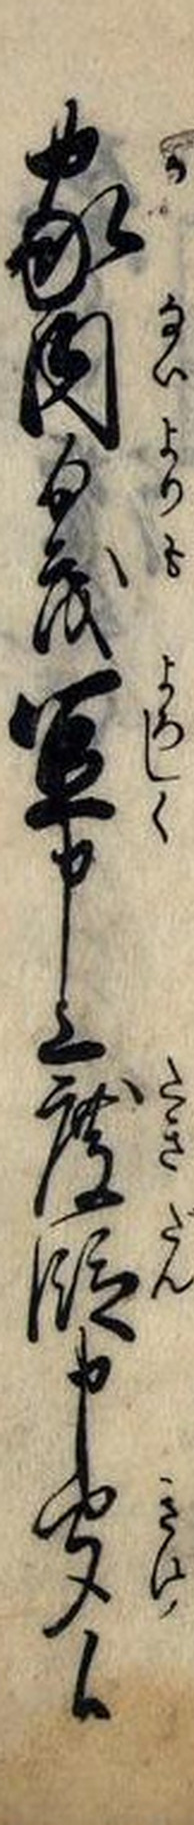家内ゟも宜申上度段申聞候

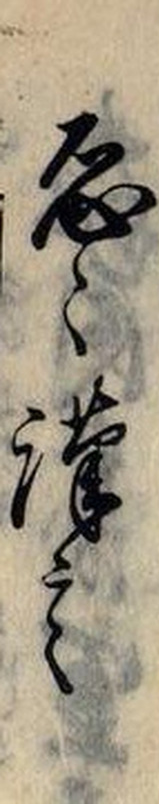恐々謹言
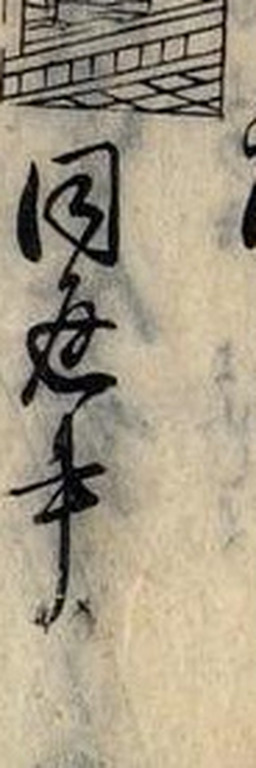同返事
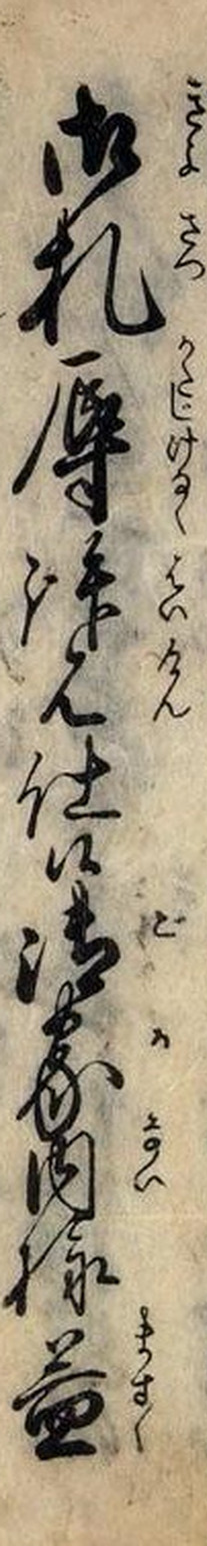御札辱拝見仕候御家内様益
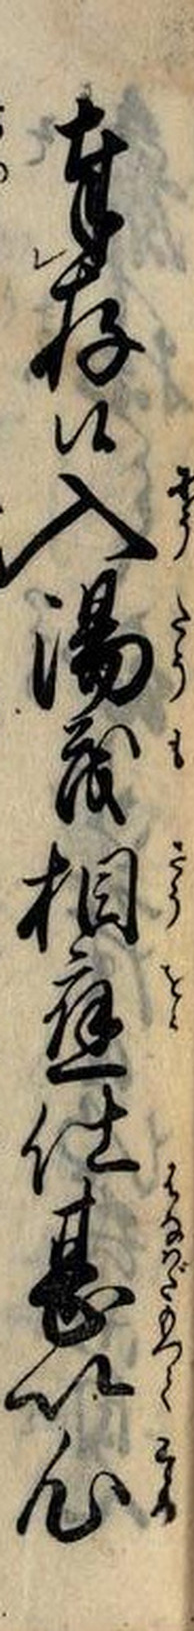奉存候入湯も相應仕甚以心
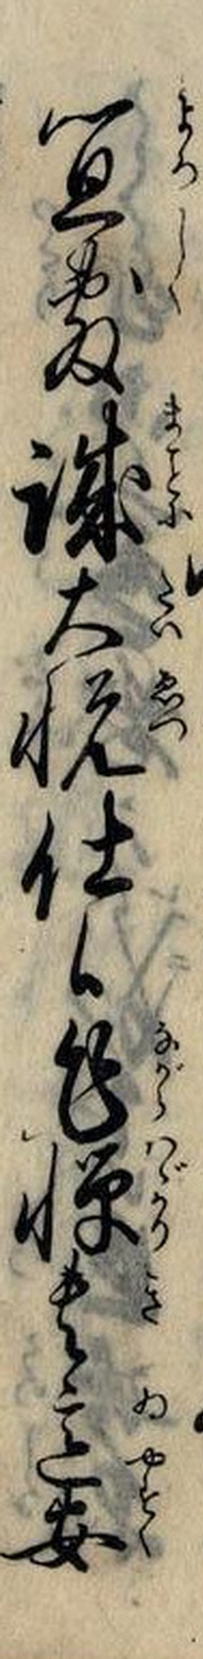宜敷誠大悦仕候乍憚貴意安
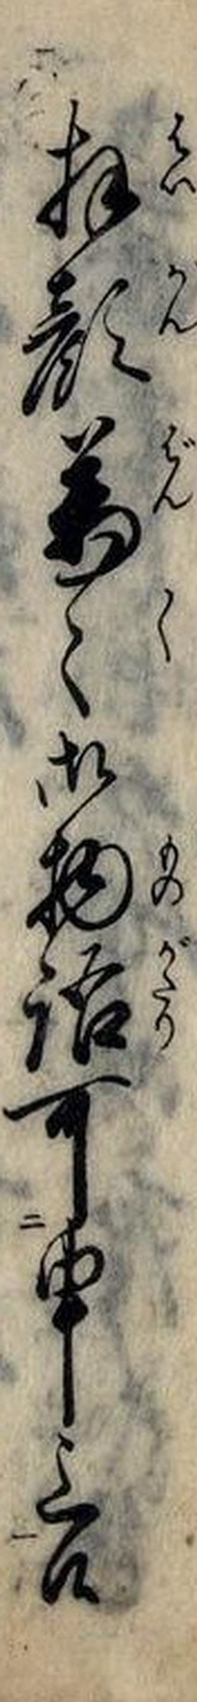拝顔萬々御物語可申上候
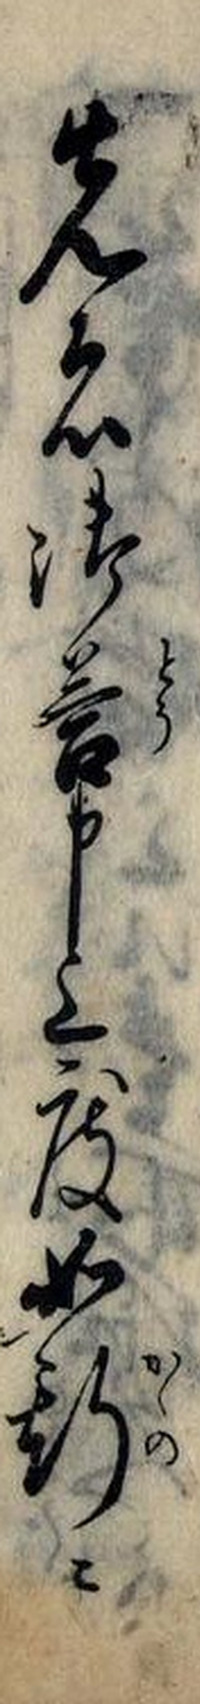先者御答申上度如斯に
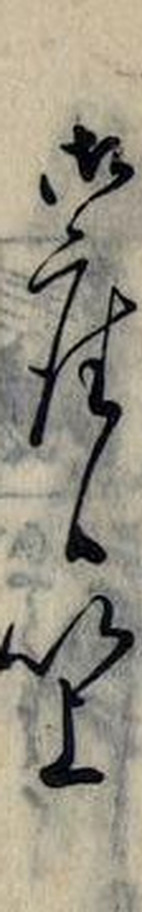御座候以上

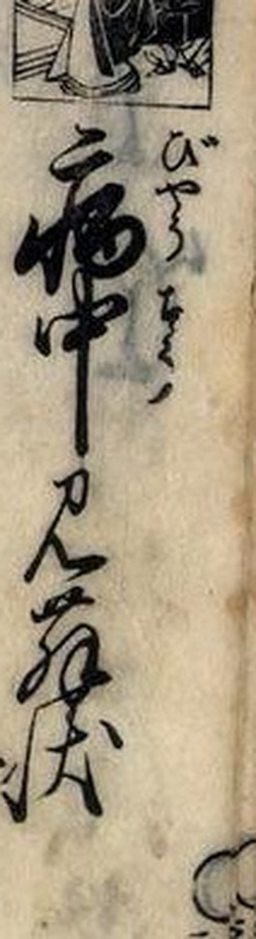病中見舞状
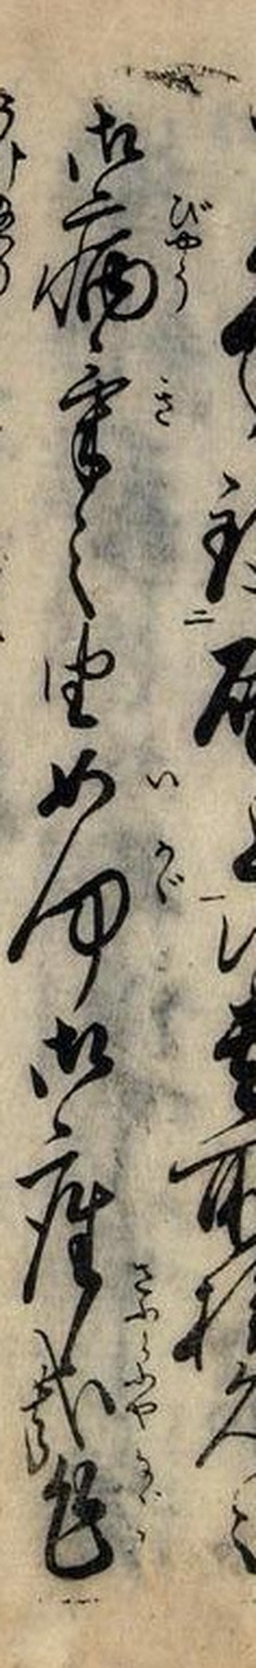御病氣之由如何御座候哉乍
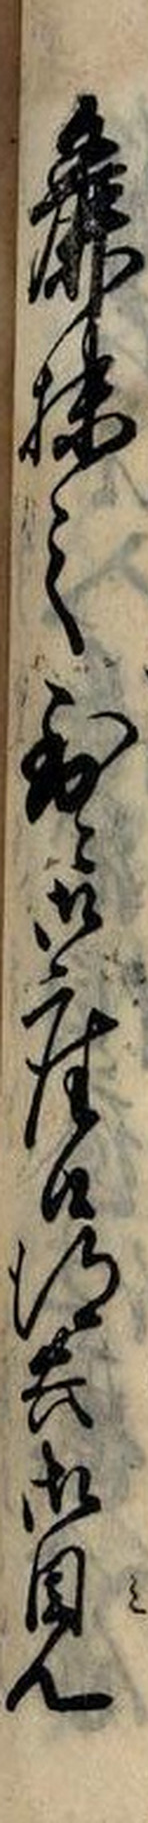麁抹之至に御座候得共御見
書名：大成用文章（往来物）
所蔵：福井県文書館 Fukui Prefectural Archives
